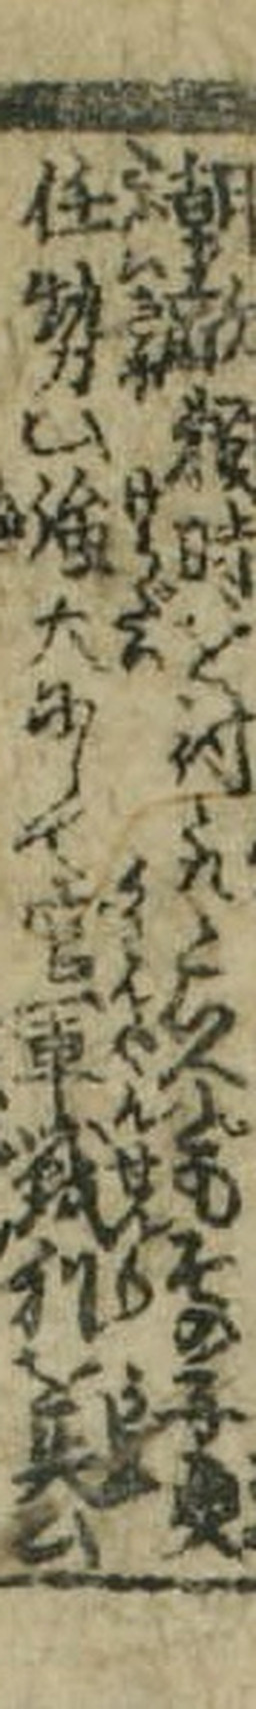任勢ひ強大にして官軍戦利を失ひ
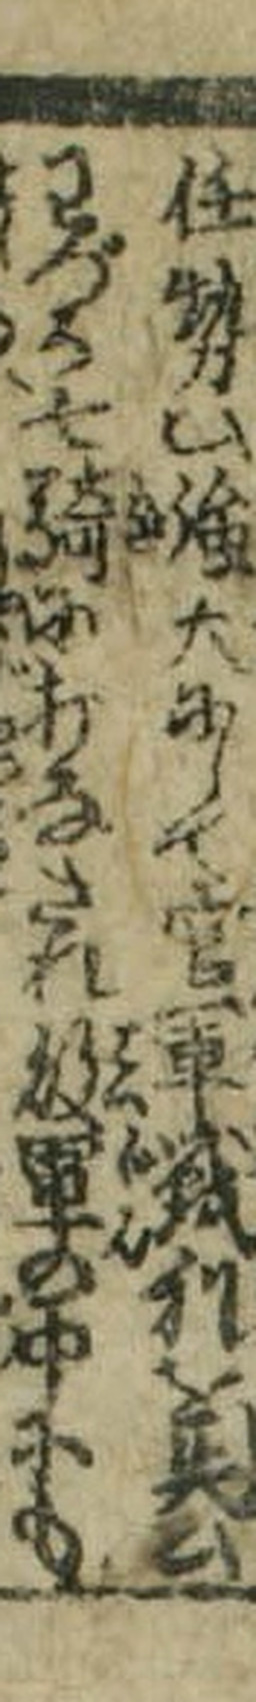わづか七騎に打なされ敗軍の中にも
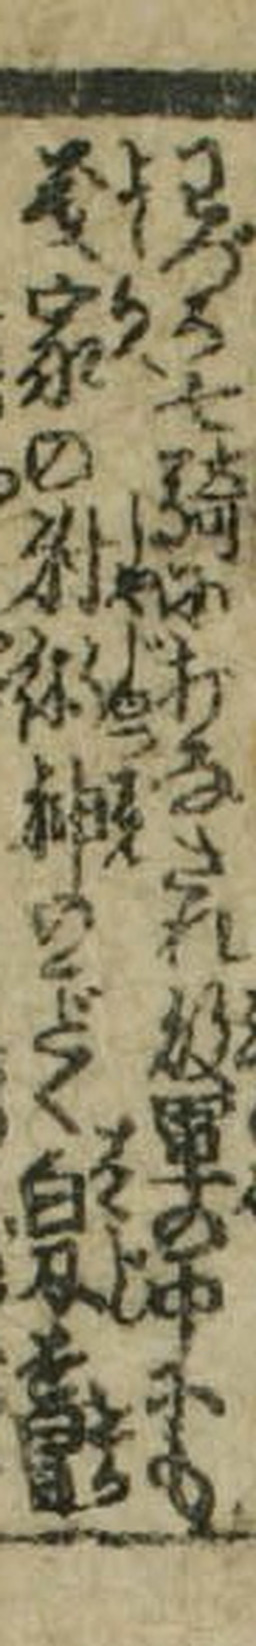義家の射術神のごとく白刃を冒
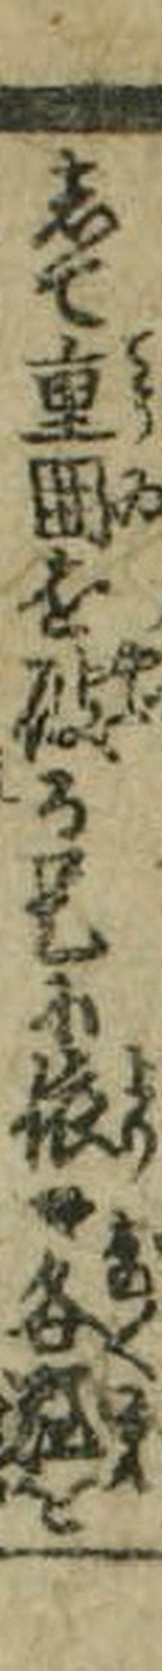して重囲を破る是に依●各難を
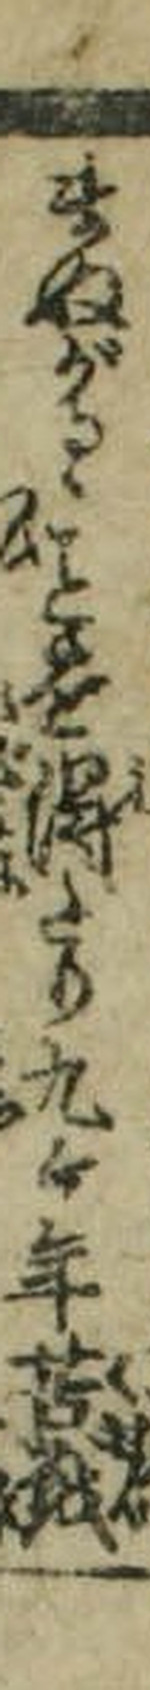まぬがるゝことを得たり九ケ年苦戦
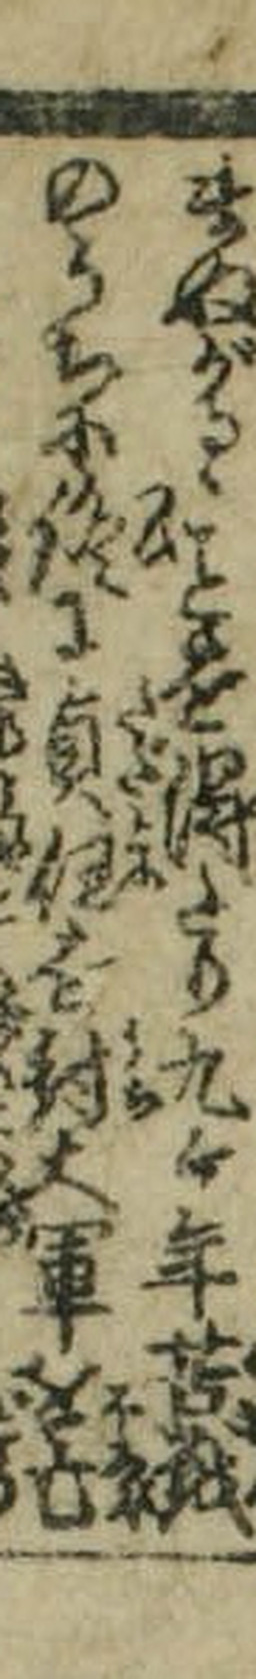のうちに終に貞任を討大軍を亡
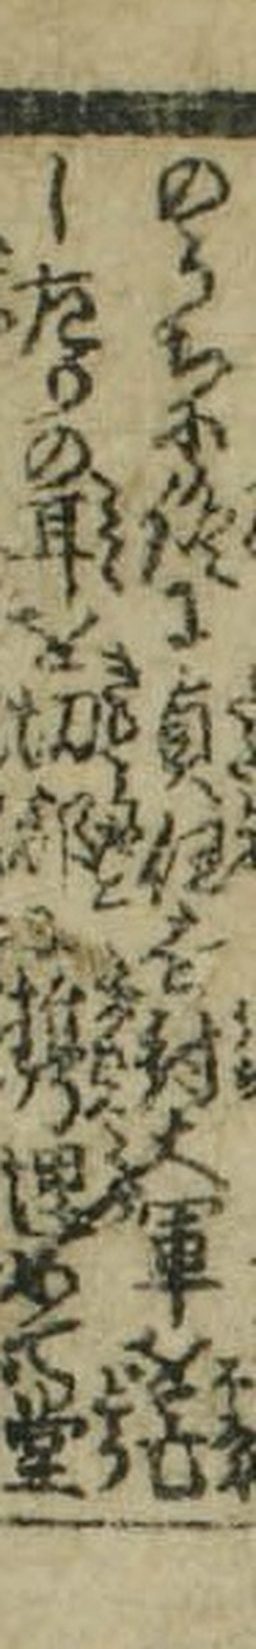し左りの耳を切都に携埋めて堂
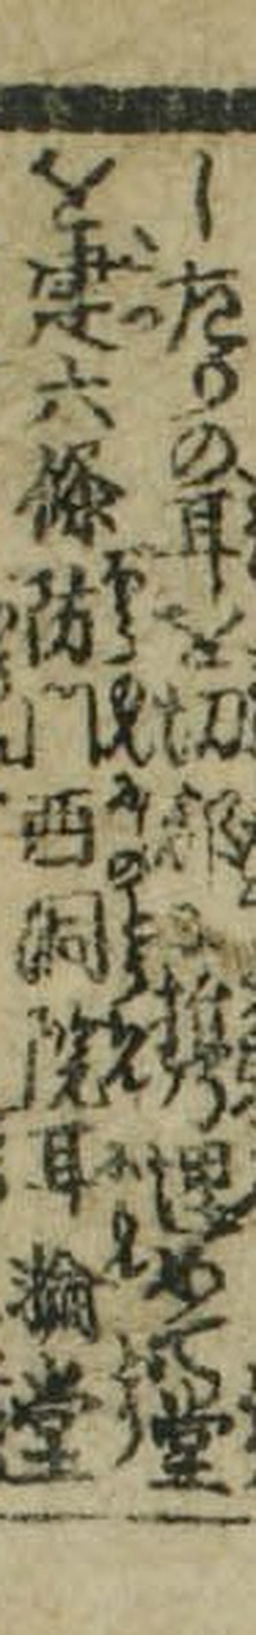を建六條防門の西洞院耳輪堂
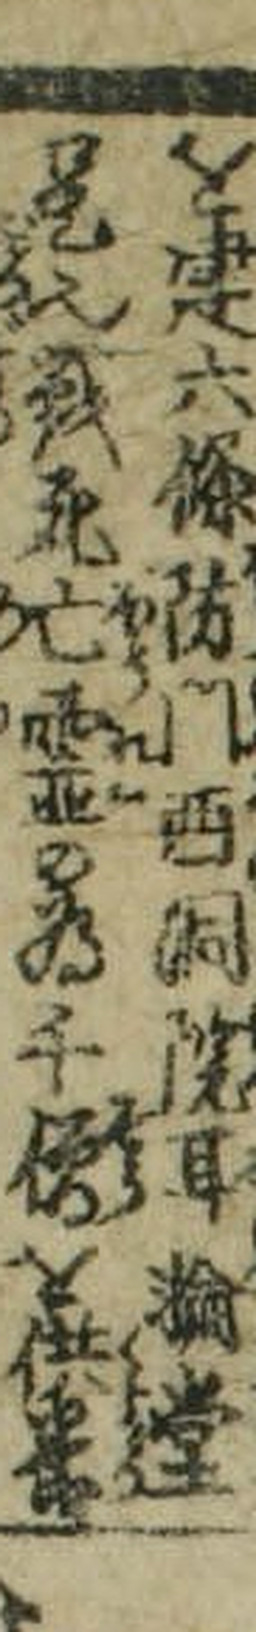是也戦死亡霊の為千僧を供養
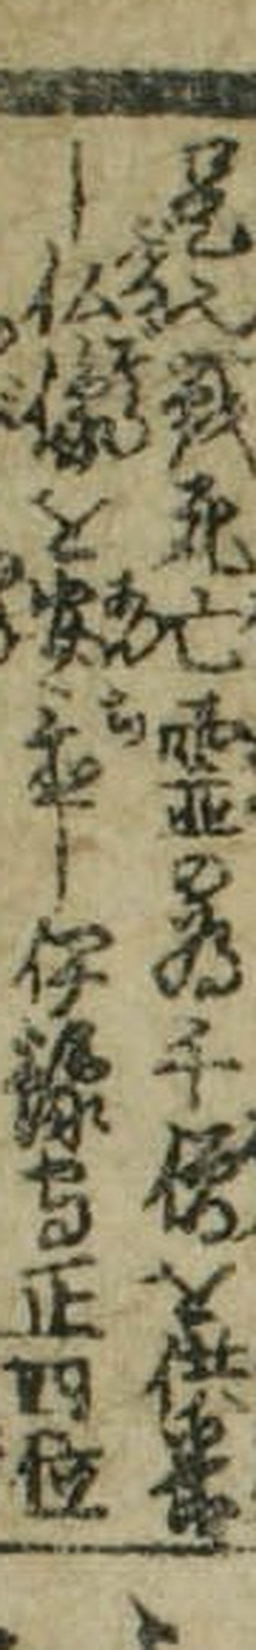し仏像を安置し伊豫守正四位
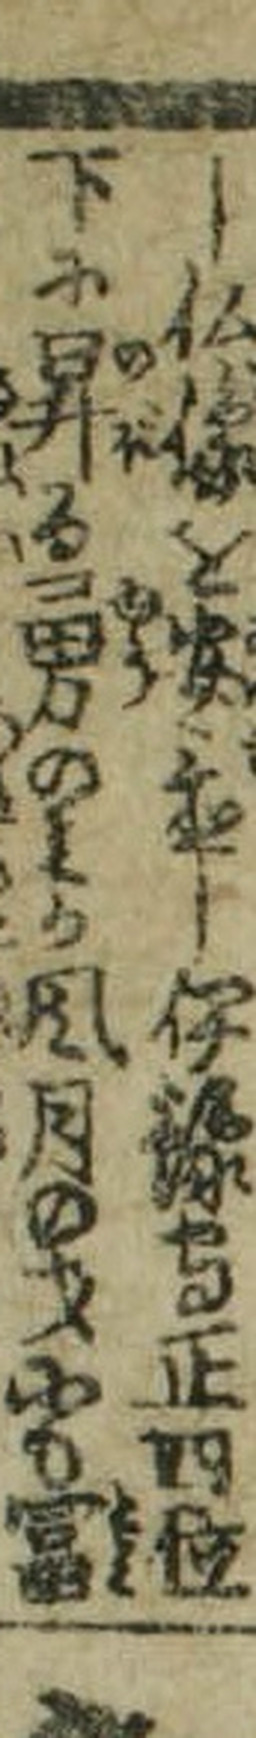下に昇る勇のみか風月の才にも富
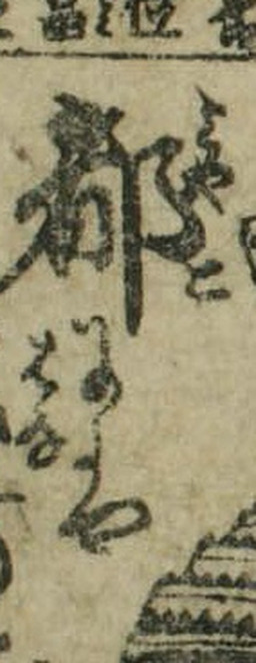都には
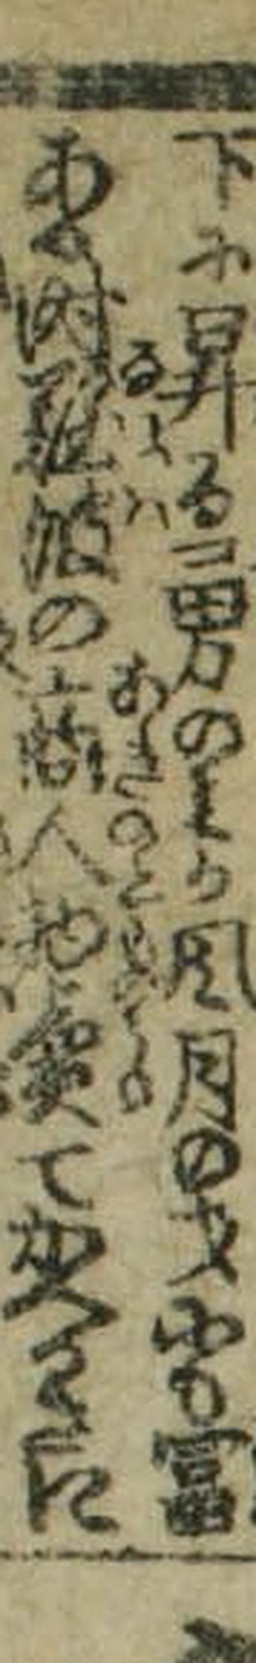ある時難波の商人物売てかへるさに
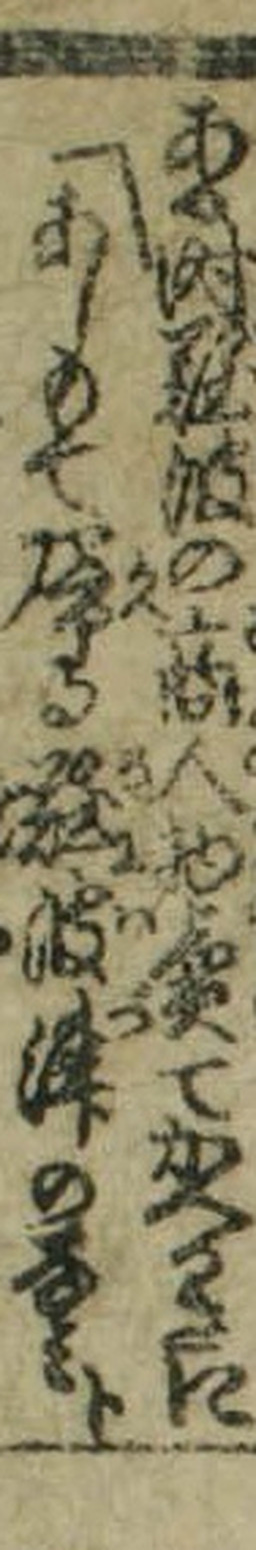〽あしもて帰る難波津のなみと
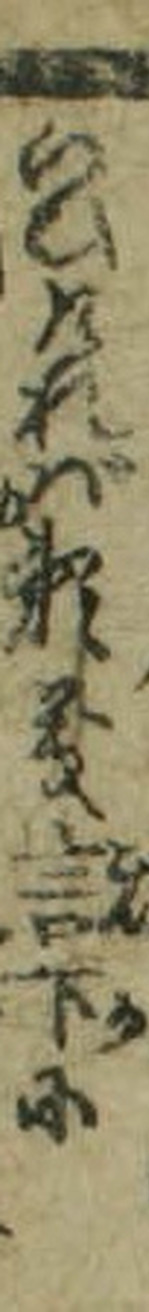いひければ頼義言下に
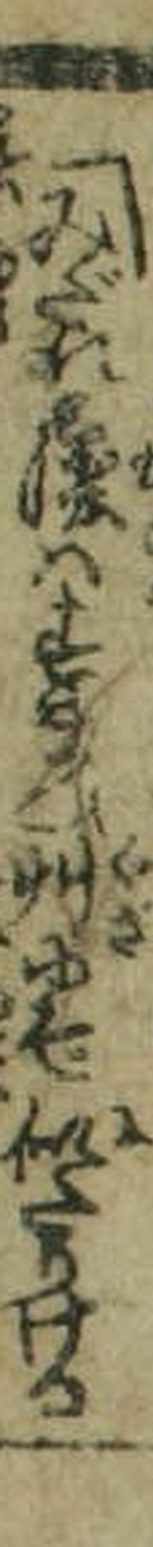〽みだれ藻はすまひ草にぞ似たりける
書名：續英雄百人一首
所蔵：東京学芸大学附属図書館
